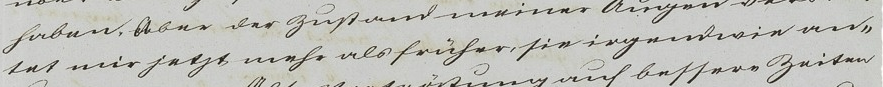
tet mir jetzt, mehr als früher, sie irgendwie an-
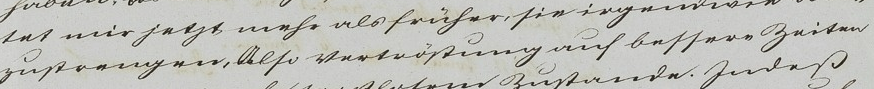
zustrengen. Also Vertröstung auf bessere Zeiten
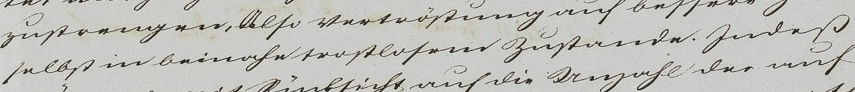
selbst in beinahe trostlosem Zustande. Indeß
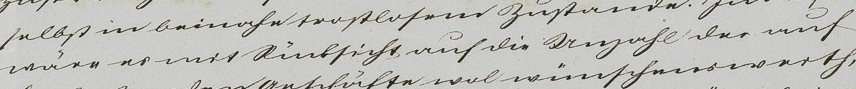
wäre es mit Rücksicht auf die Anzahl der auf
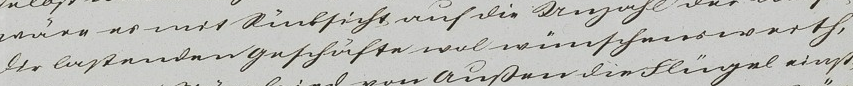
Dir lastenden Geschäfte wol wünschenswerth,
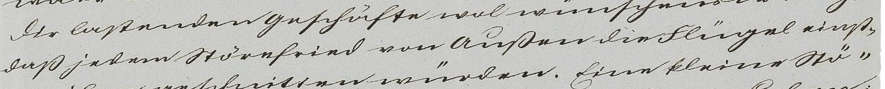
daß jedem Störefried von Aussen die Flügel einst-
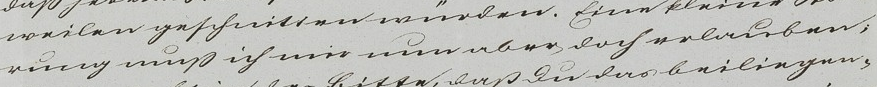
rung muß ich mir nun aber doch erlauben;
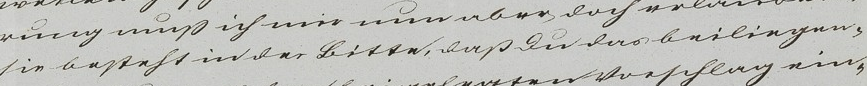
sie besteht in der Bitte, daß Du das beiliegen-
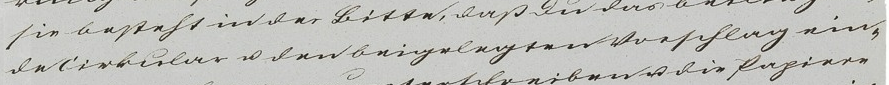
de Cirkular & den beigelegten Vorschlag ein-
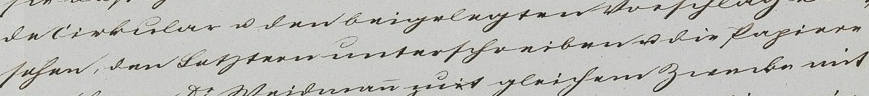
sehen, den Letztern unterschreiben & die Papiere
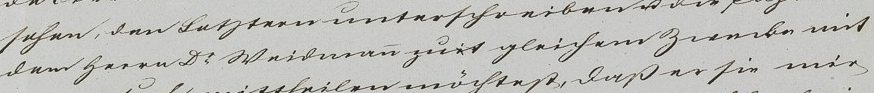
dem Herrn DrWeidmann zu gleichem Zwecke mit
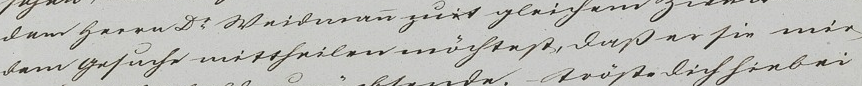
dem Gesuche mittheilen möchtest, daß er sie mir
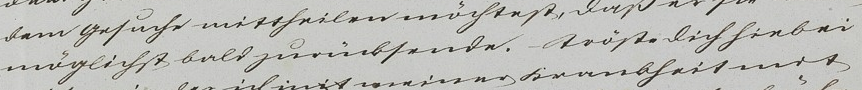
möglichst bald zurücksende. Tröste Dich hiebei
